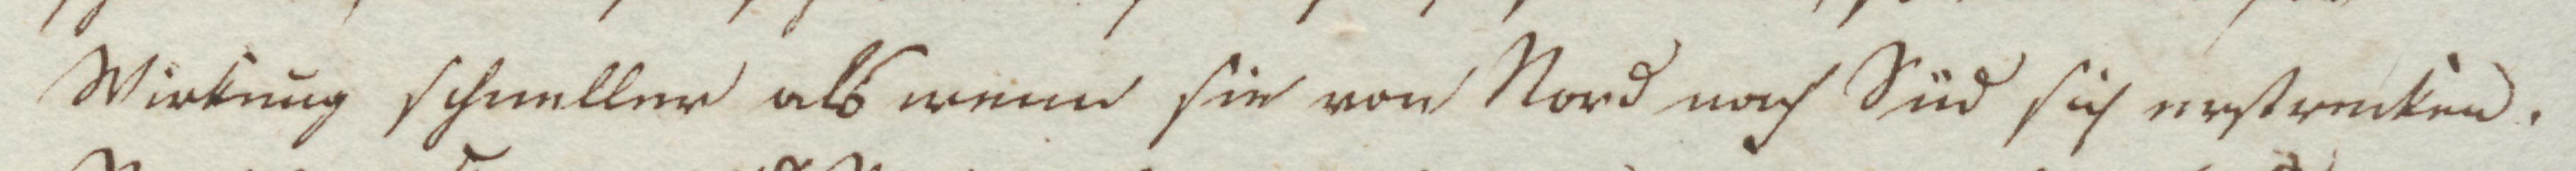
Wirkung schneller als wenn sie von Nord nach Süd sich erstrecken.
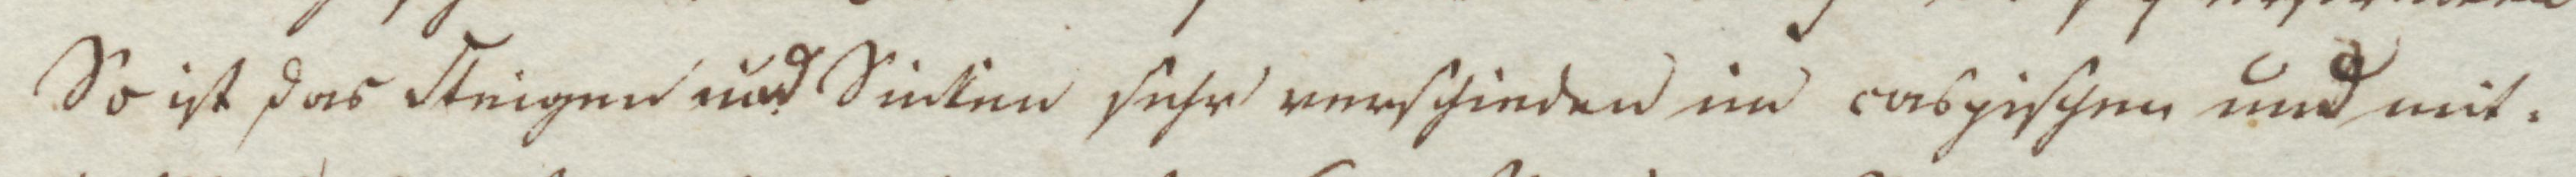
So ist das Steigen u.und Sinken sehr verschieden im caspischen und mit-
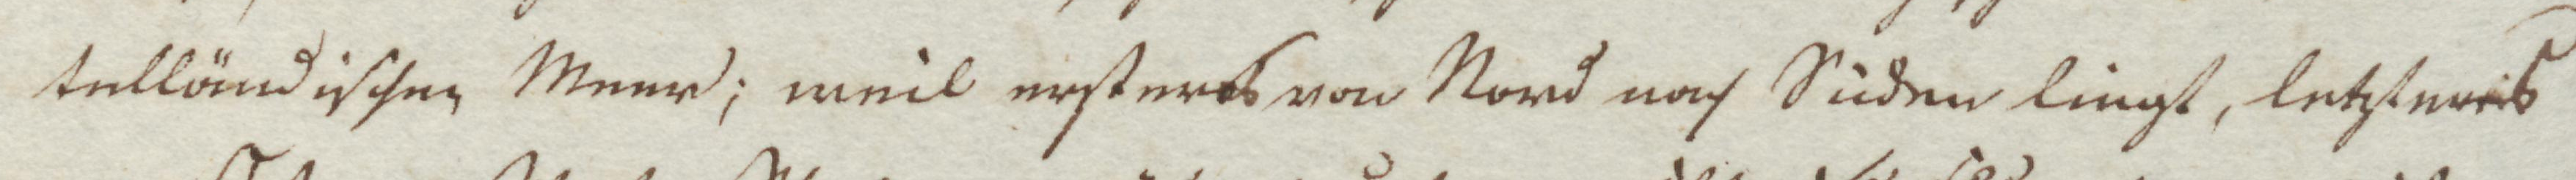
telländischen Meer; weil ersterses von Nord nach Süden liegt, letzterses
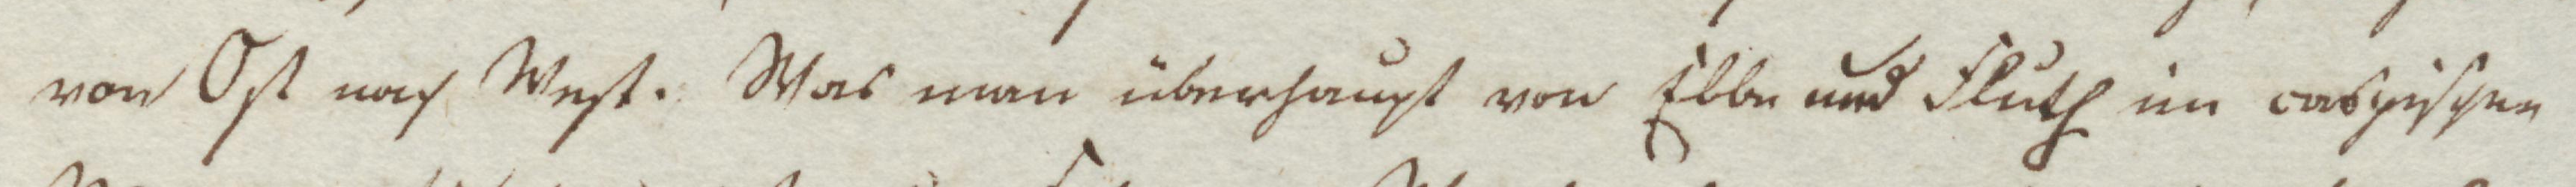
von Ost nach West. Was man überhaupt von Ebbe u.und Fluth im caspischen
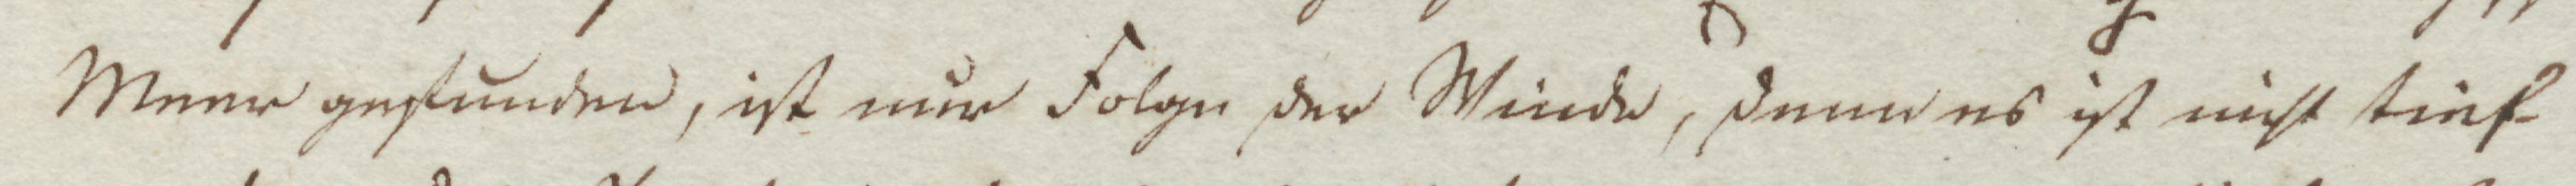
Meer gefunden, ist nur Folge der Winde, denn es ist nicht tief
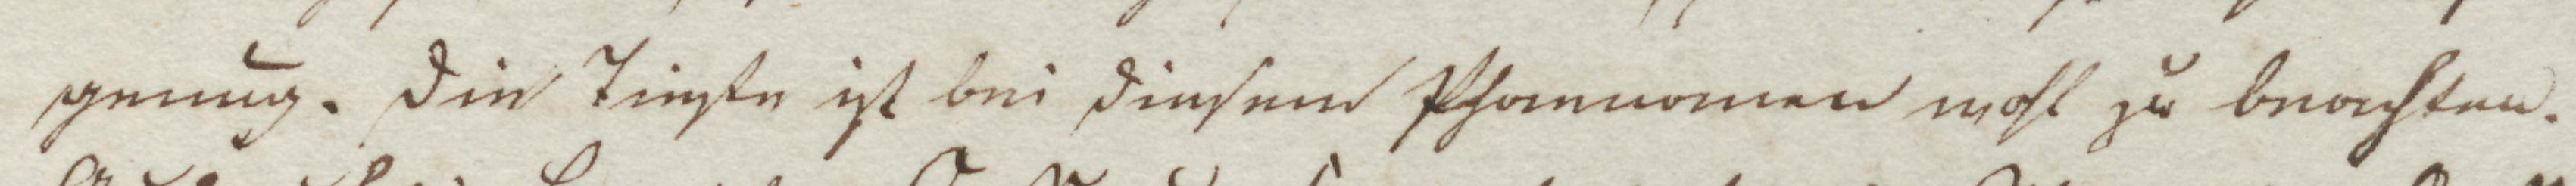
genug. Die Tiefe ist bei diesem Phaenomen wohl zu beachten.
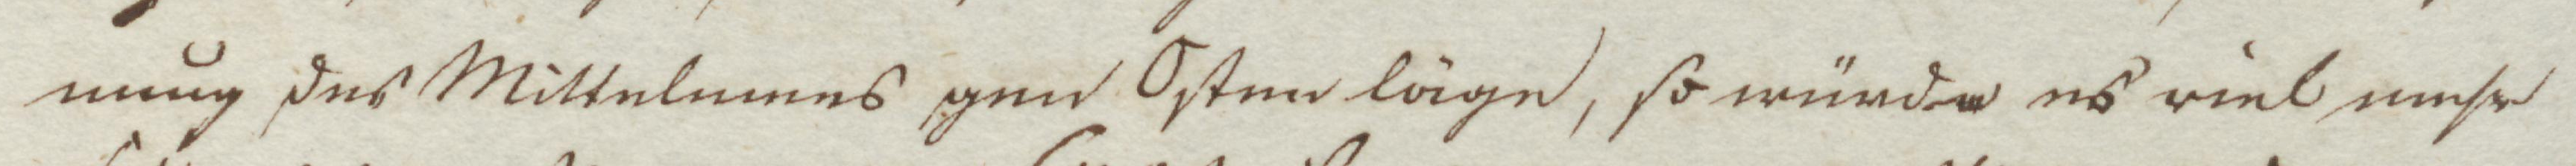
nung des gen Osten läge, so würde es viel mehr
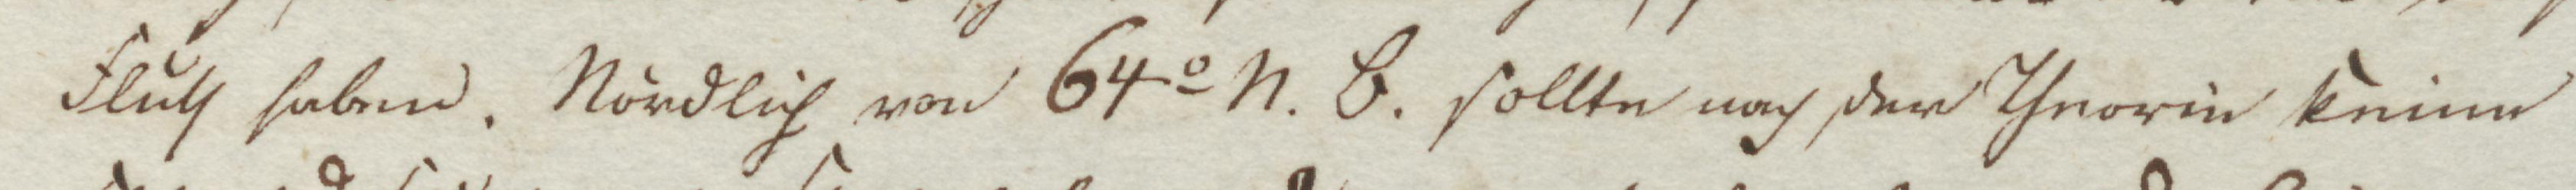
Fluth haben. Nördlich von 64° N. B. sollte nach der Theorie keine
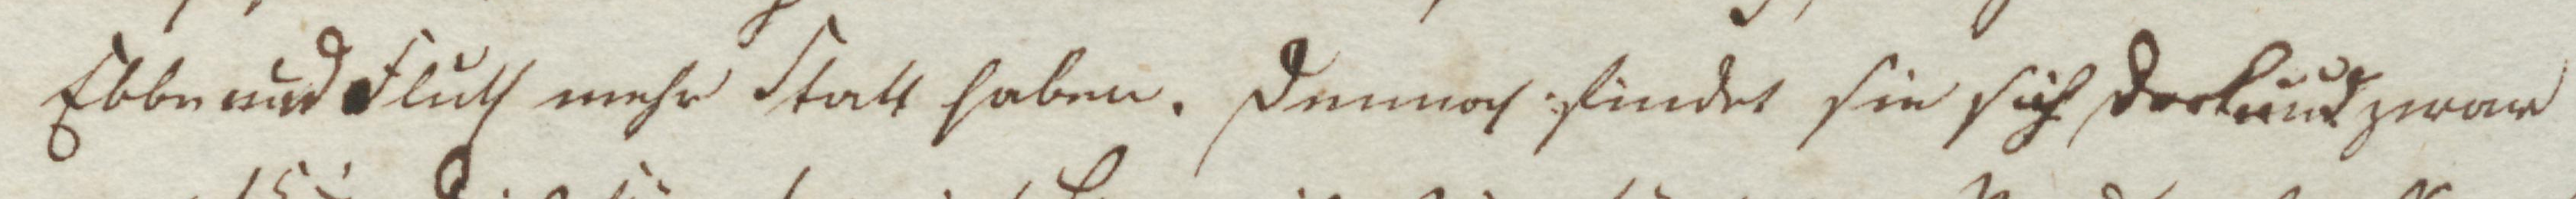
Ebbe u.und Fluth mehr Statt haben. Dennoch findet sie sich dort u.und zwar
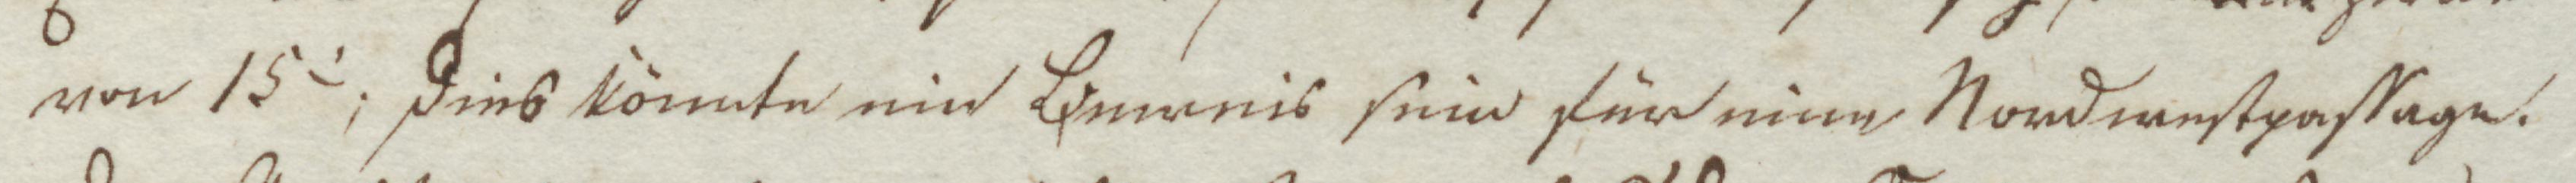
von 15′; dies könnte ein Beweis sein für eine Nordwestpassage.
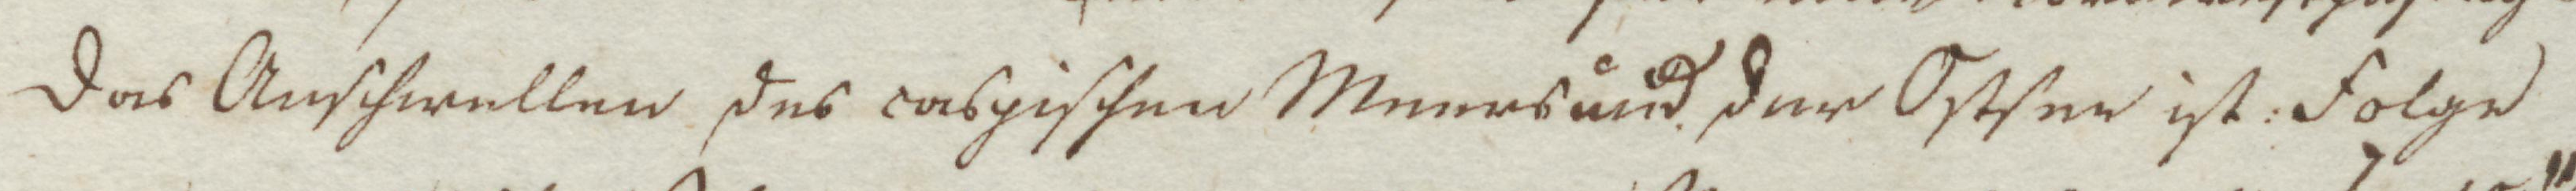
Das Anschwellen des caspischen Meers u.und der Ostsee ist Folge
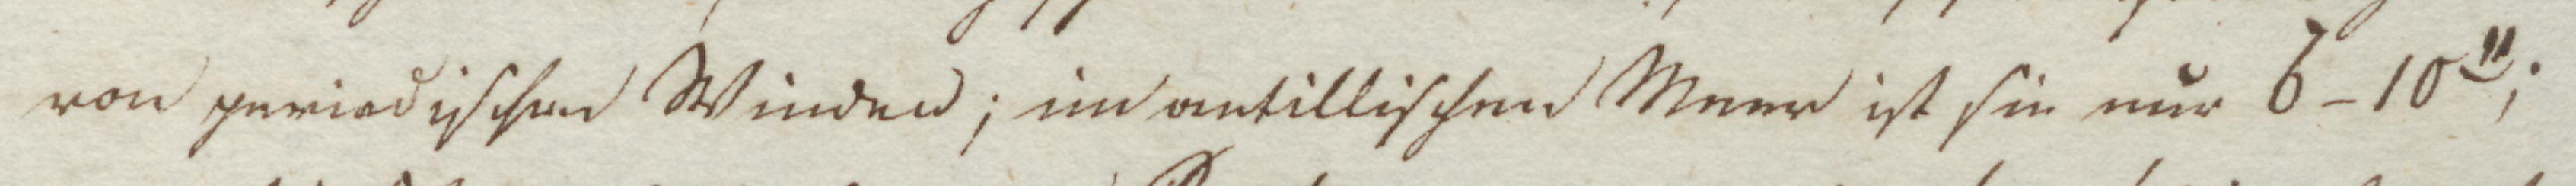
von periodischen Winden; im antillischen Meer ist sie nur 6–10″;
